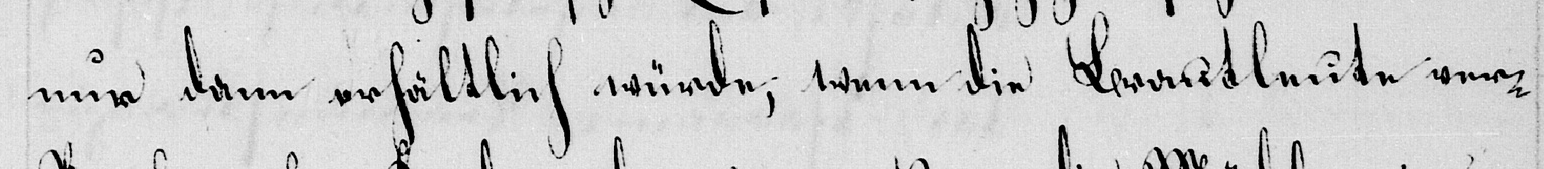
nur dann erhältlich würde, wenn die Brautleute ver¬
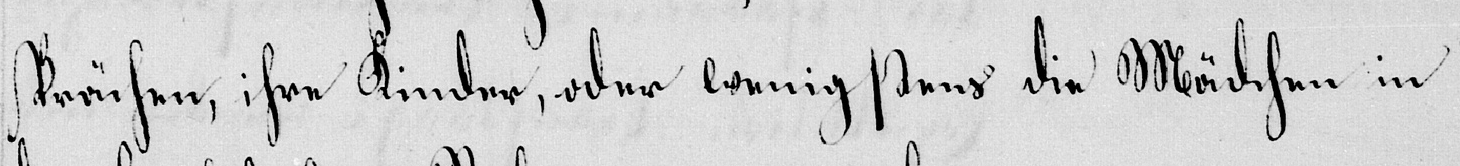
sprächen, ihre Kinder, oder wenigstens die Mädchen in
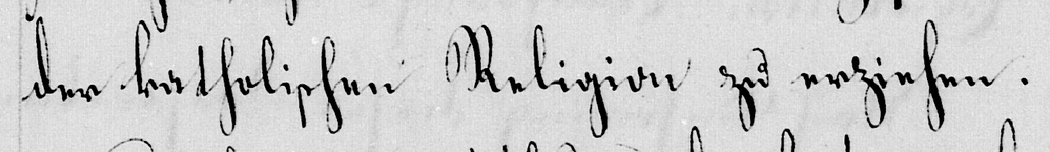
der katholischen Religion zu erziehen.
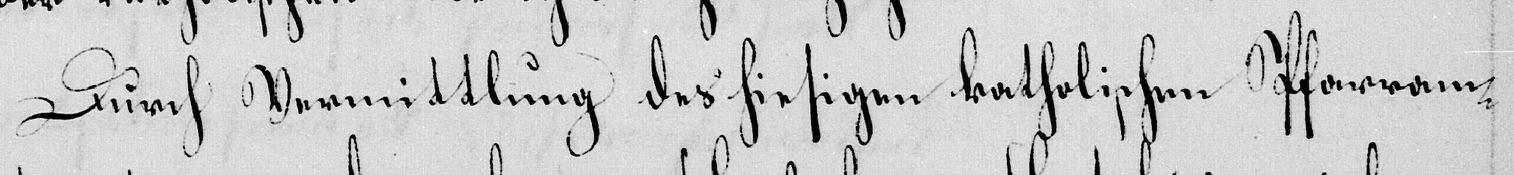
Durch Vermittlung des hiesigen katholischen Pfarram¬
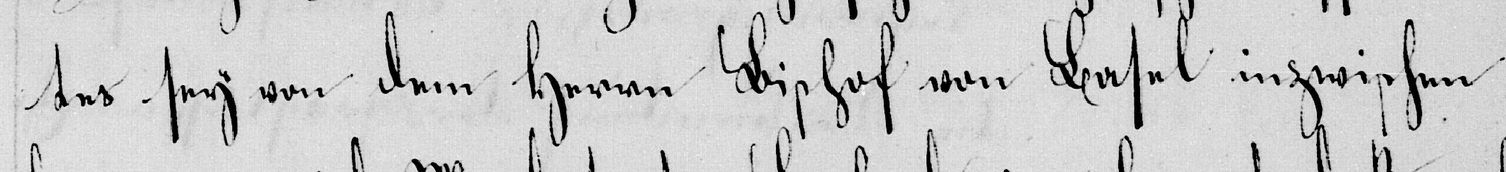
tes sey von dem Herrn Bischof von Basel inzwischen
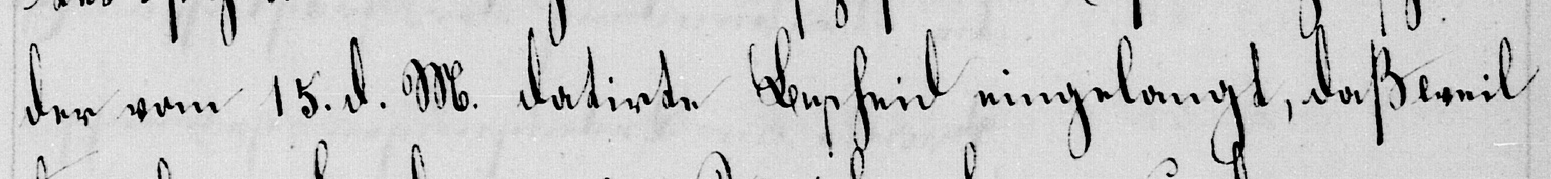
der vom 15. d. M. datirte Bescheid eingelangt, daß weil
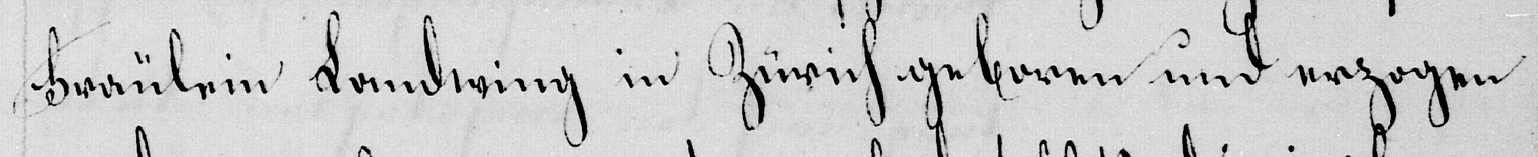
Fräulein Landwing in Zürich geboren und erzogen
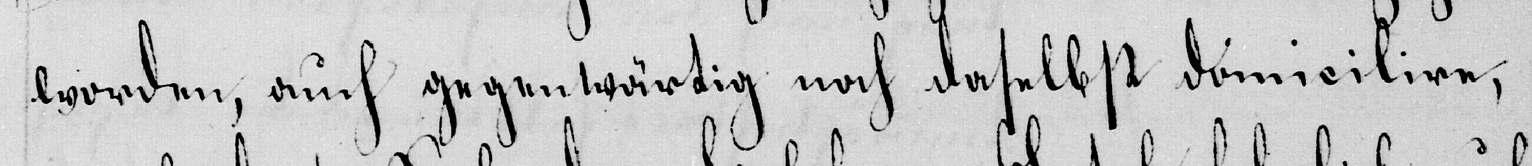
worden, auch gegenwärtig noch daselbst domicilire,
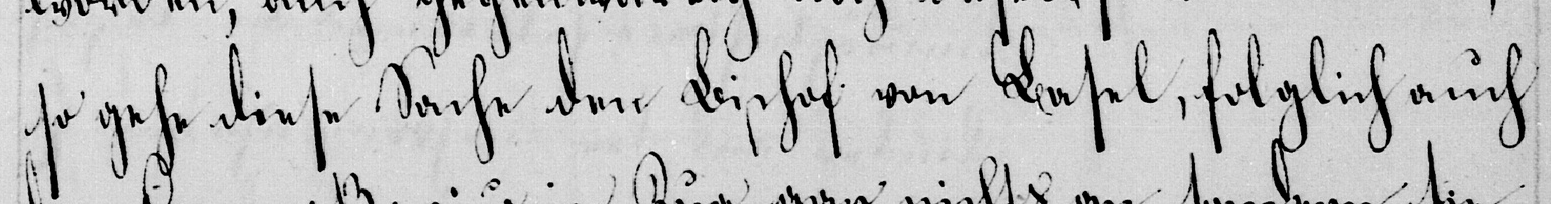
so gehe diese Sache den Bischof von Basel, folglich auch
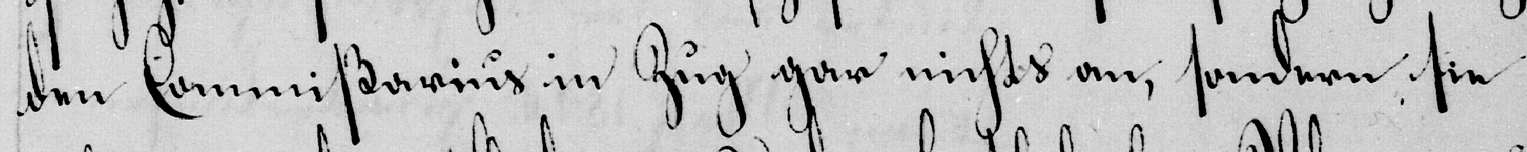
den Commißarius in Zug gar nichts an, sondern sie
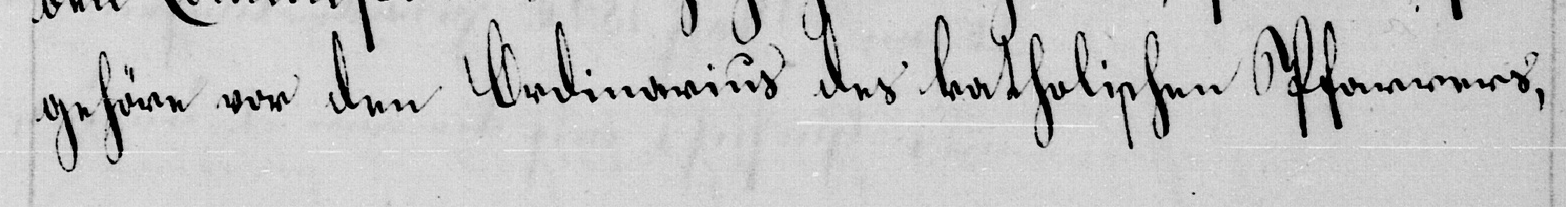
gehöre vor den Ordinarius des katholischen Pfarrers,
